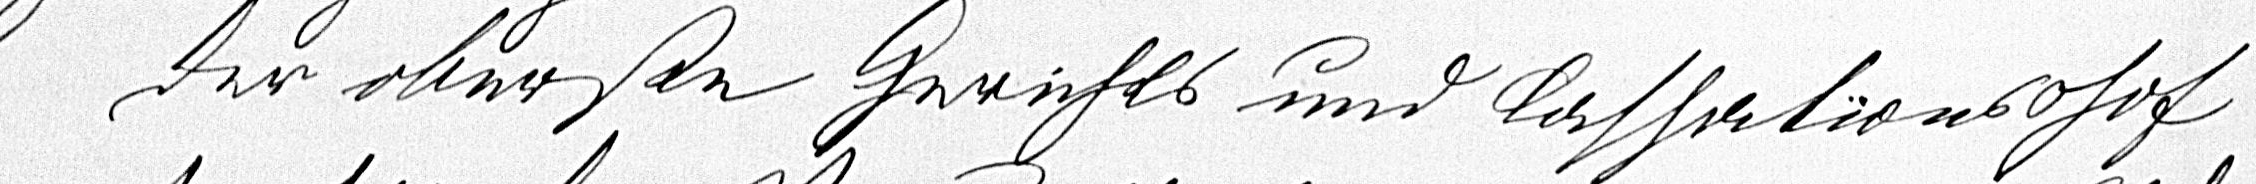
Der oberste Gerichts und Cassationsshof
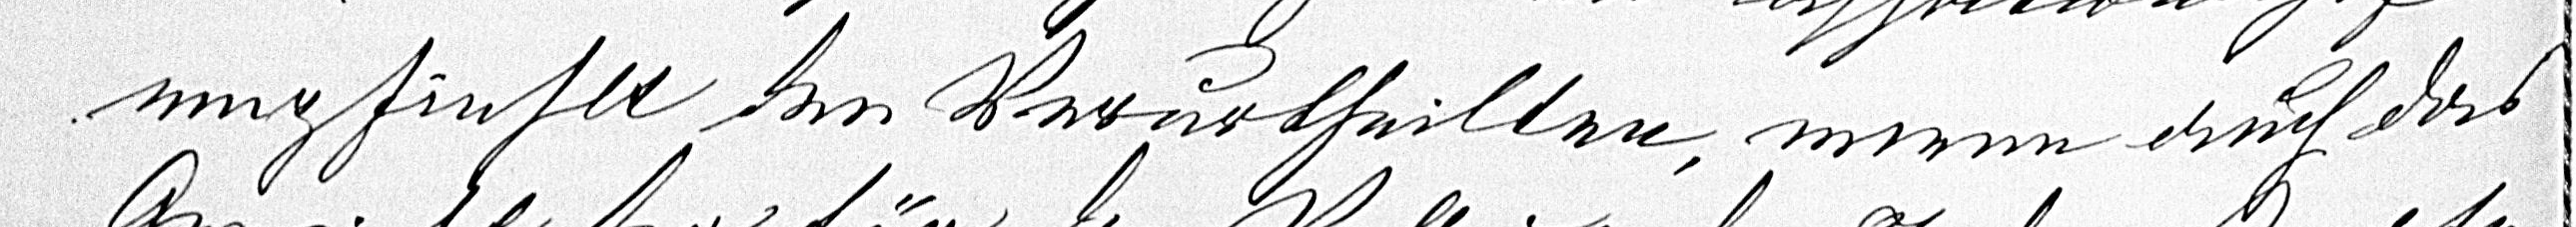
empfiehlt den Verurtheilten, wenn auch das
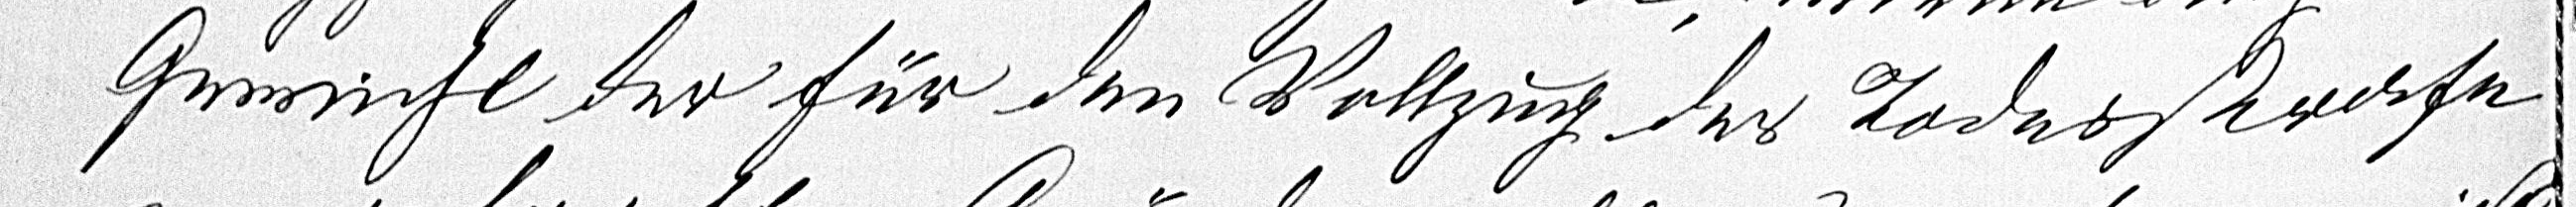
Gewicht der für den Vollzug der Todesstrafe
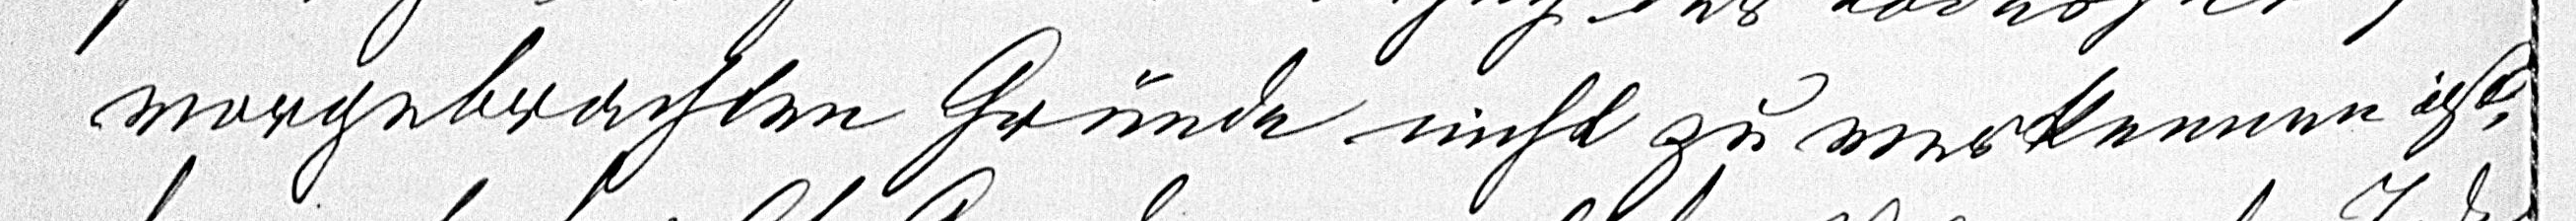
vorgebrachten Grunde nicht zu verkennen ist,
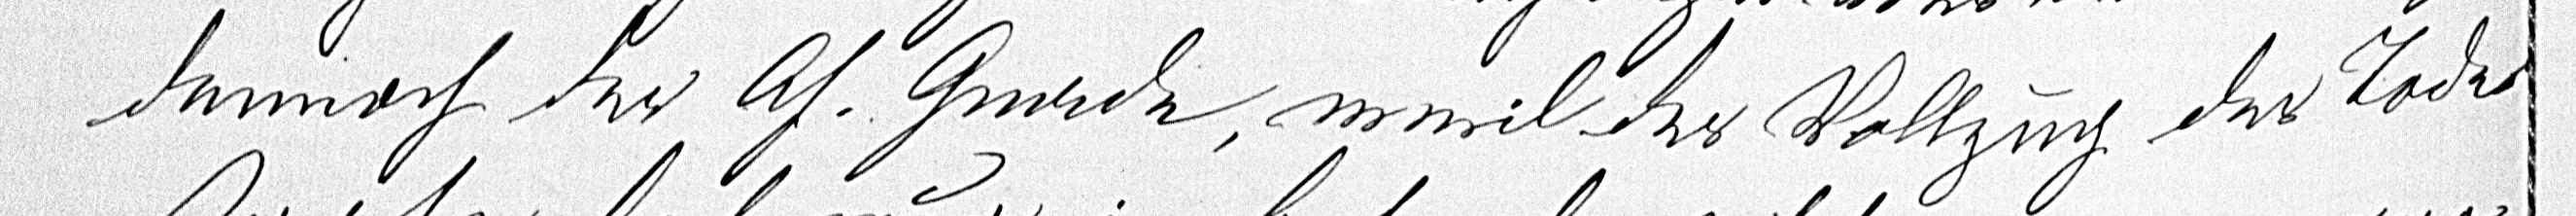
dennoch der Ah. Gnade, weil der Vollzug der Tode¬
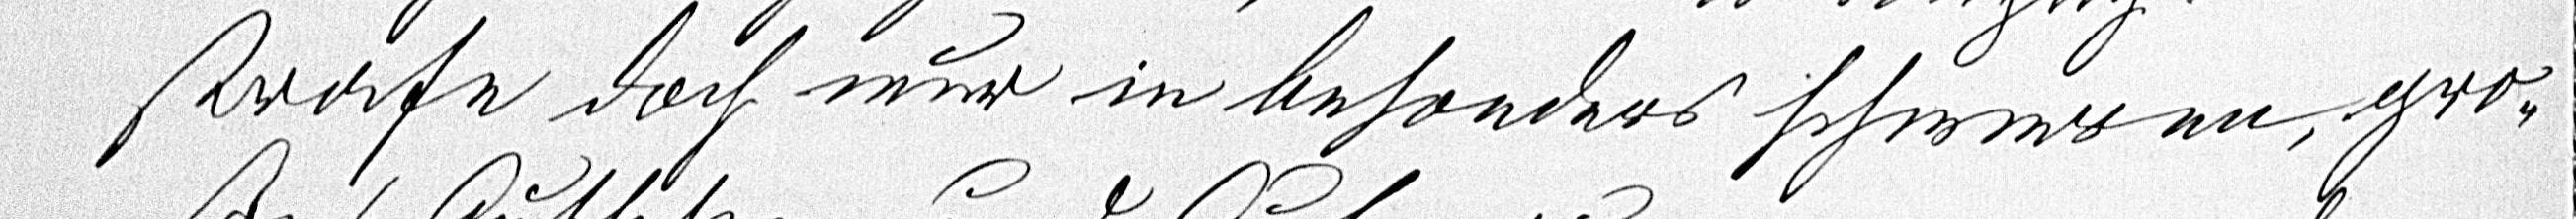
sstrafe doch nur in besonders schweren, gro¬
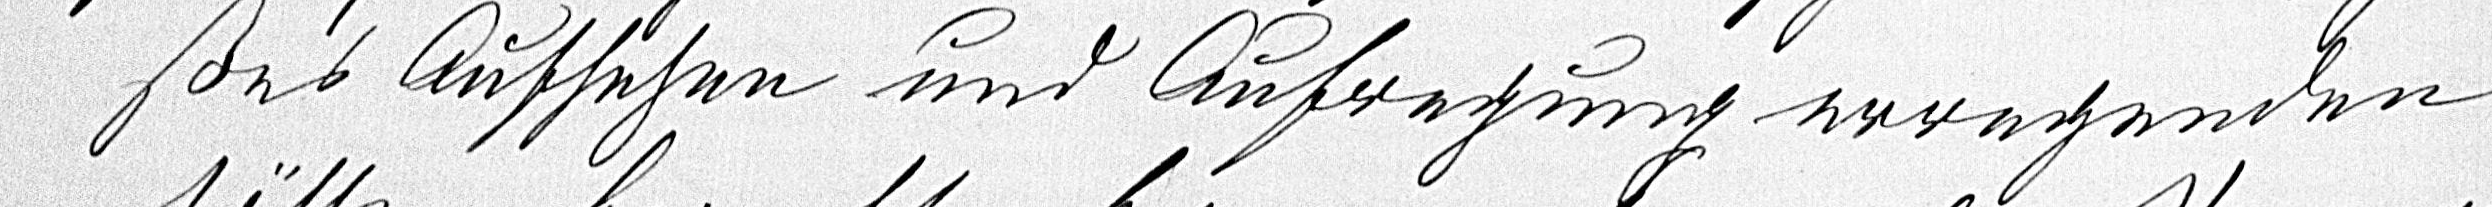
ßes Aufsehen und Aufregung erregenden
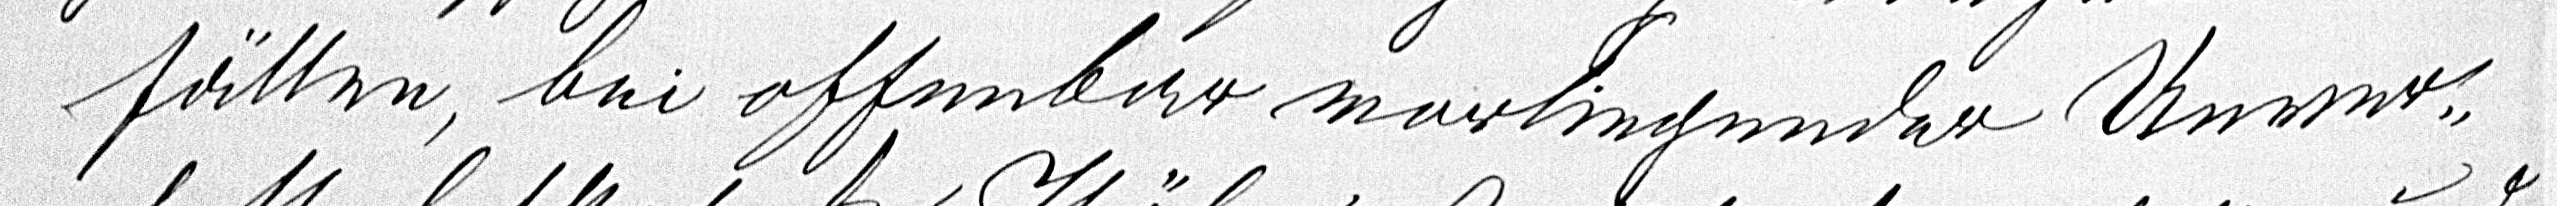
fällen, bei offenbar vorliegender Unver¬
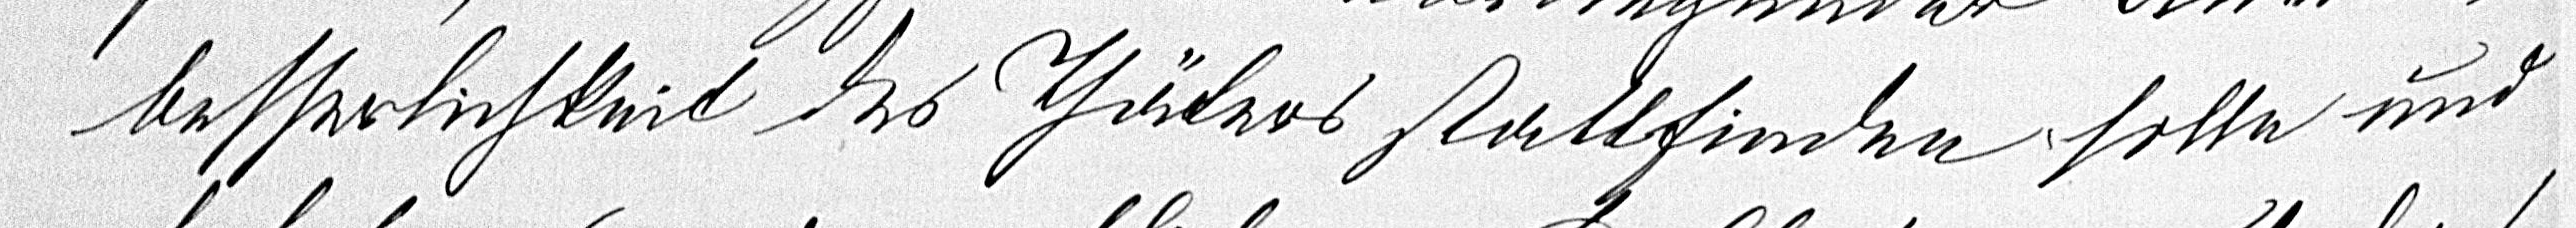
besserlichkeit des Thäters stattfinden solle und
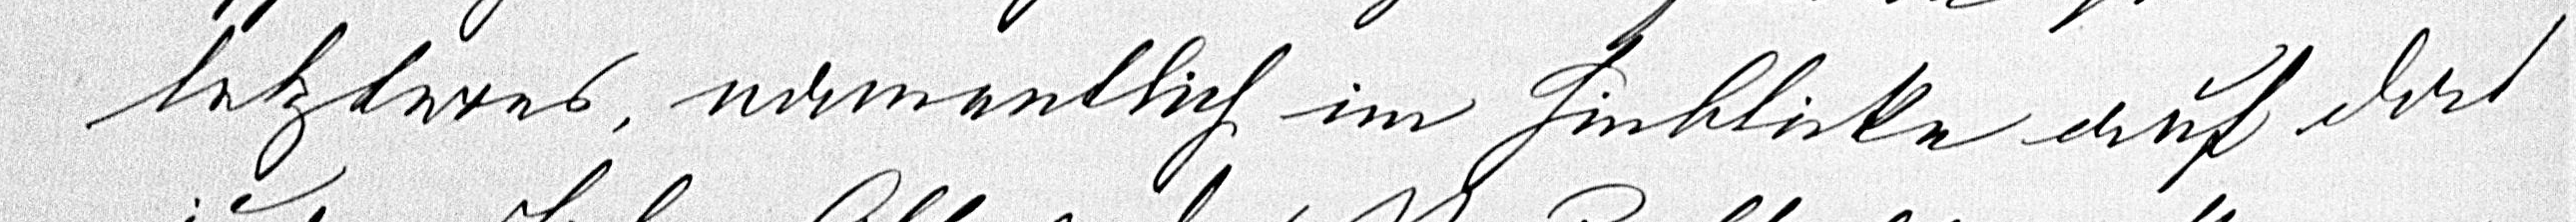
letzteres, namentlich im Hiblicke auf das
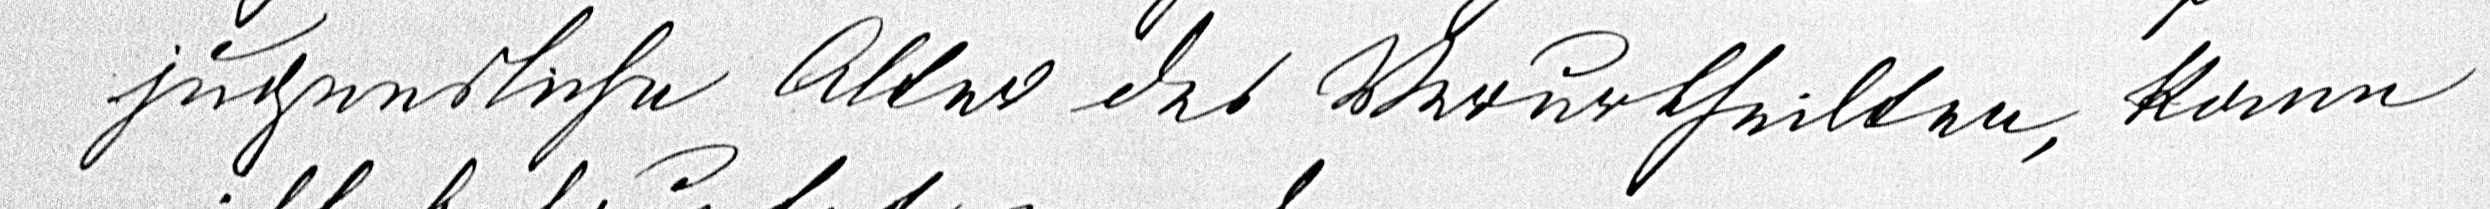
jugendliche Alter des Verurtheilten, kann
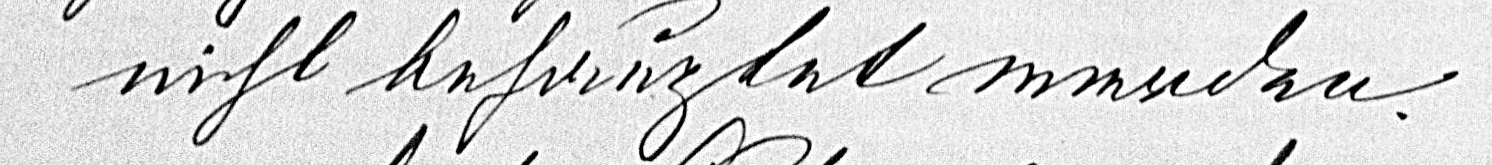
nicht behauptet werden.
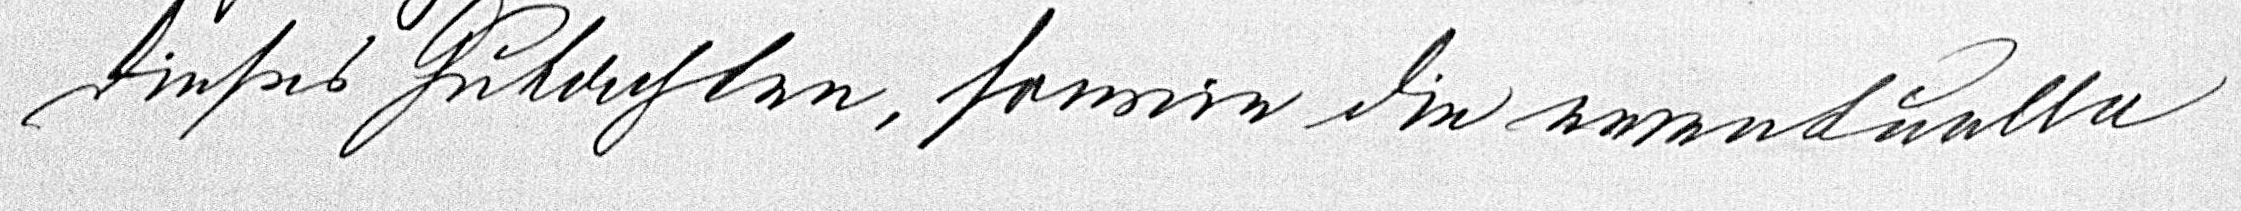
Dieses Gutachten, sowie die eventuelle
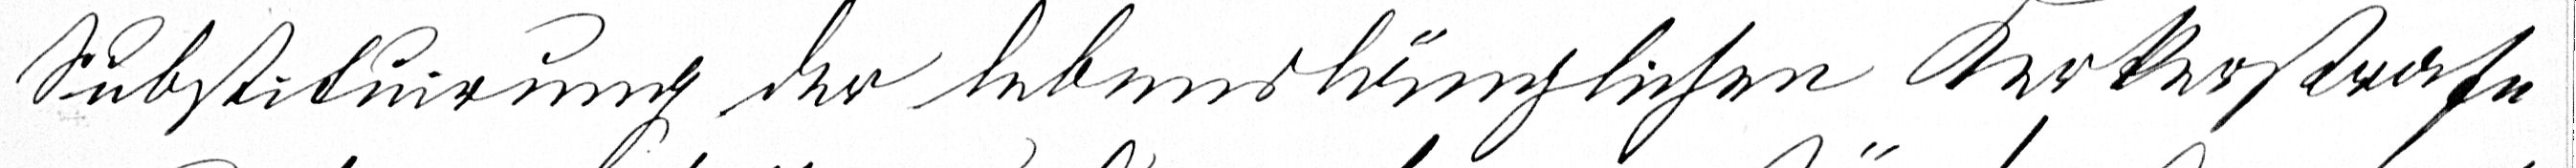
Substituirung der lebenslänglichen Kerkerstrafe
